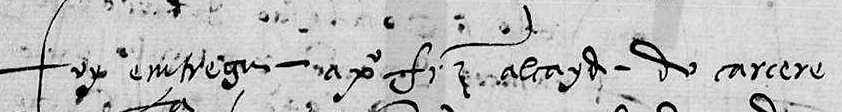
Foy emtregue a po frz̄ alcayde do carcere
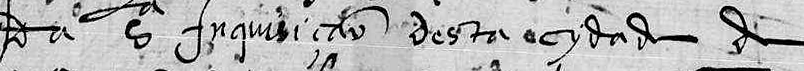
da Sta Jnquisiçaõ desta cydade de
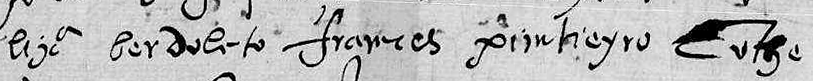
lixa berdoleto framces pimtieyro cōthe
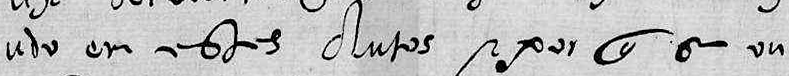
udo em estes Autos e por q̅ se ou
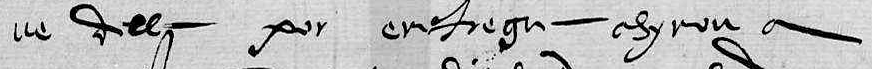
ue delle por emtregue asynou a
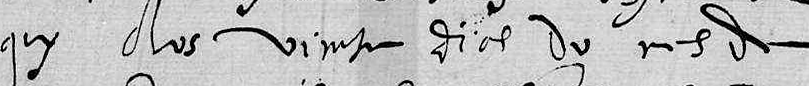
quy Aos vimte dias do mes de
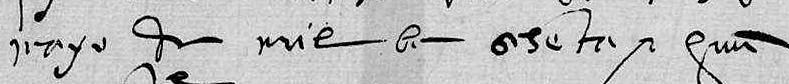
mayo de mil bc sesēta e huū
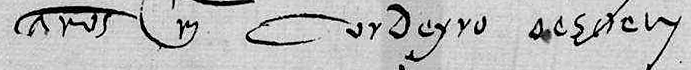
an̄os mel Cordeyro o escreuy
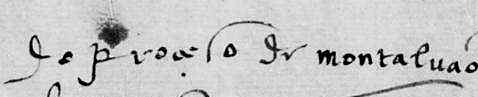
do proceso de montaluaõ
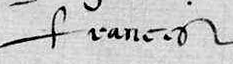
frances
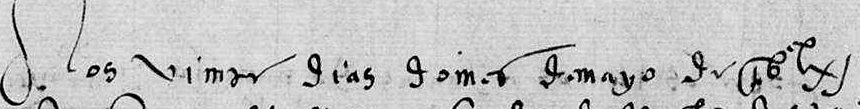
Aos vimte dias do mes de mayo de j̄ bc lxj
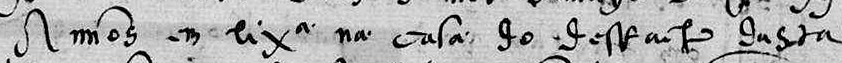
Annos em lixa na casa do despacho da sta
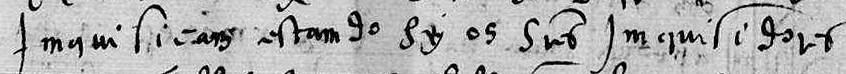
Jmquisiçam estamdo hy os Srēs Jmquisidores
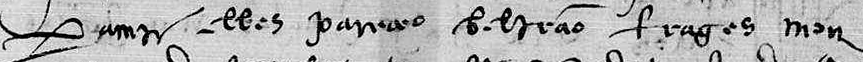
ꝑamte elles pareceo beltrão frages mon
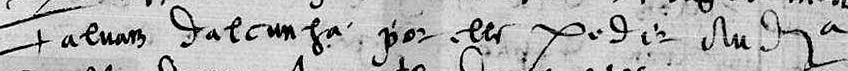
taluam dalcunha por elle pedir Audja
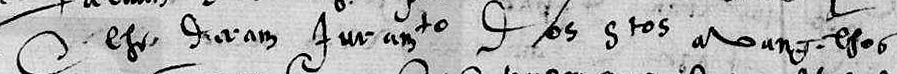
e lhe deram Juramto dos Stos avangelhos
